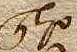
q̄ ho
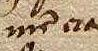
mē era
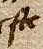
este
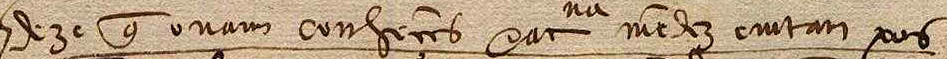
deze q̄ o nam conhecēs e a cna m̄edez emtam pos
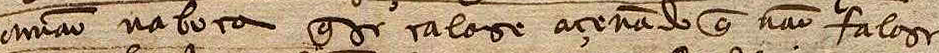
a mão na boca q̄ se calase acenādo q̄ não falase
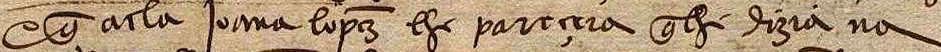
e q̄ a ela Joana lopez lhe parecera q̄ lhe dizia na
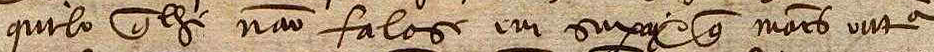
quilo q̄ lhe não falase em seu pay e q̄ maes outa
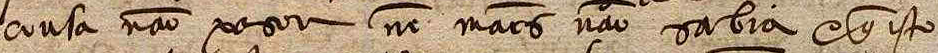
cousa não pasou nē maes não sabia e q̄ isto
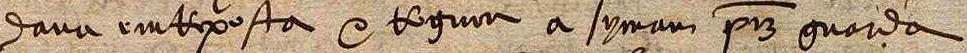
daua em Reposta e Roguou a symam p̄iz guarda
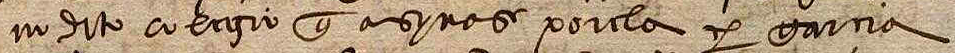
no djto colegio q̄ asynase por ela cꝭ garcia
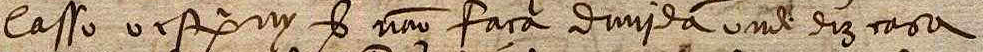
lasso o estpiuy não faça duujda onde diz casa
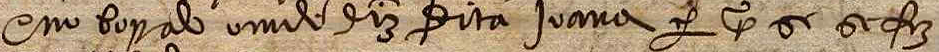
e no borrado omde diz dita Joana cꝭ p̄o se se fez
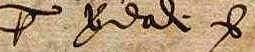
p̄o ꝟdade
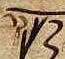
p̄yz
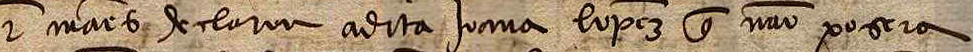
item maes declarou a dita Joana lopez q̄ não posera
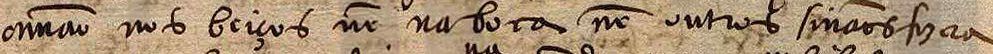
a mão nos beiços nē na boca n̄e outros sinaes fizera
